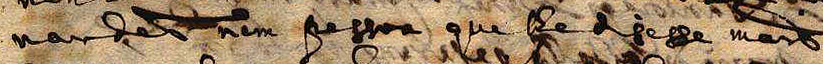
nardes nem pessoa que lhe disesse mais
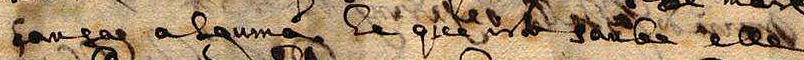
cousa alguma he que isto soube elle
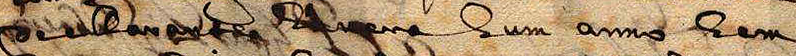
decllarante hauera hum anno E em
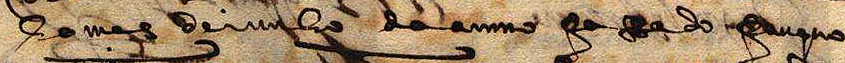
ho mes de iunho do anno passado pouquo
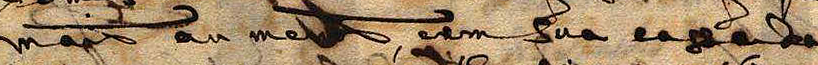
mais ou menos, e em sua cassa da
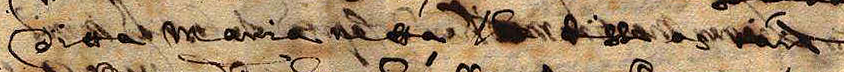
ditta maria netta lhe disse as tais
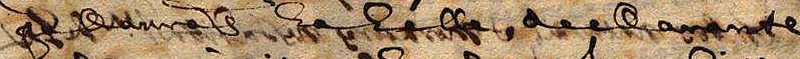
pallauras ha hélle decllarante
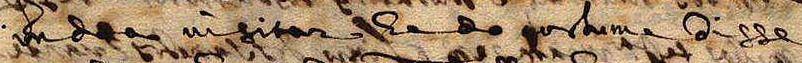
indo a uisitar he do costume disse
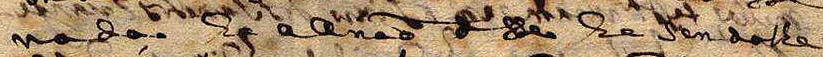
nada he all naõ disse he sendolhe
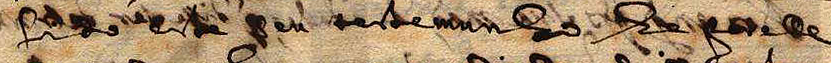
lido este seu testemunho he por elle
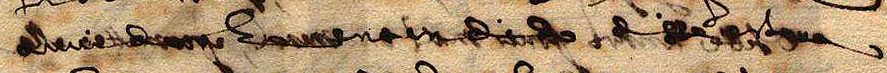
ouuido he entendido disse estaua
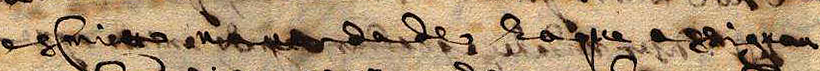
esCritto na uerdade, ho que assignou
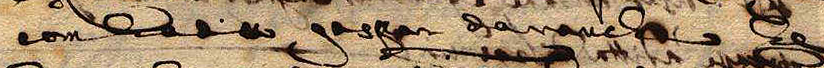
com ho ditto gaspar darouche he
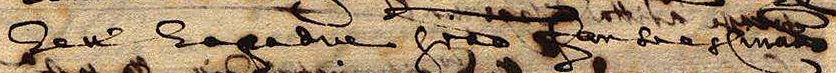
heu ho padre João farso escriuão
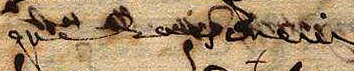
que ho escreui
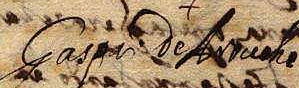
Gaspar de Arouche
